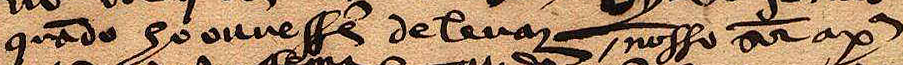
quādo ho ouuessē de leuar / nosso sōr a pa
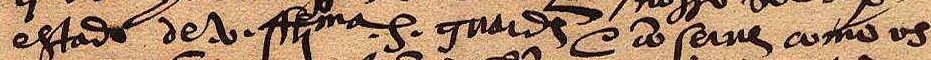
e estado de .v. Jlljma .S. guarde e cōserue como os
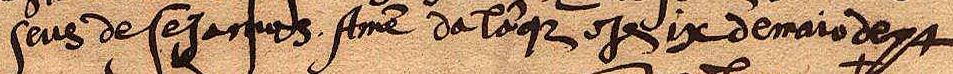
seus deseJamos. Amē dalāqr oje ix de maio de 74
